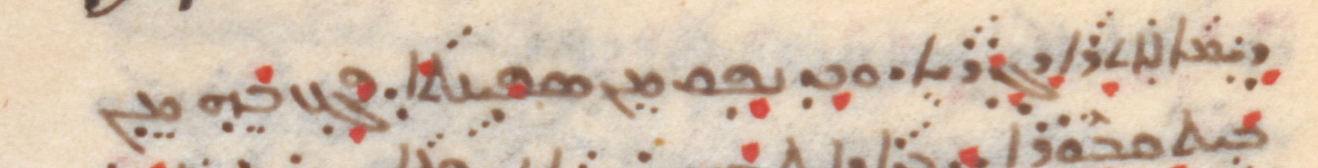ܕܝܡܐ ܠܐ ܬܪܐ ܕܓܕܪܝܐ. ܘܟܕ ܢܦܩ ܡܢ ܣܦܝܢܬܐ. ܦܓܥ ܒܗ ܡܢ
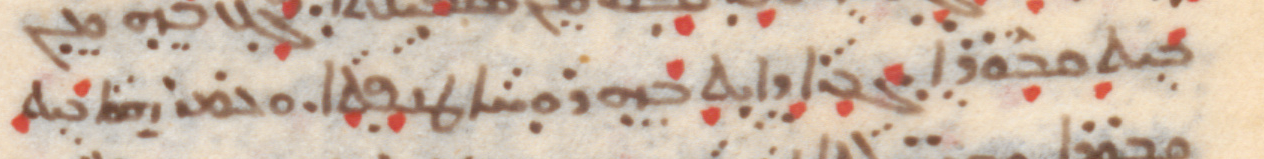ܒܝܬ ܩܒܘܪ̈ܐ܆ ܓܒܪܐ ܕܐܝܬ ܒܗ ܪܘܚܐ ܛܢܦܬܐ. ܘܥܡ̇ܪ ܗܘܐ ܒܝܬ
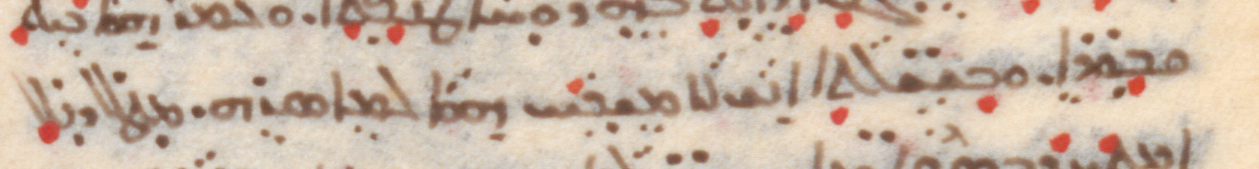ܩܒܘܪ̈ܐ. ܘܒܫܫ̈ܠܬܐ ܐܢܫ ܠܐ ܡܫܟܚ ܗܘܐ ܠܡܐܣܪܗ. ܡܛܠ ܕܟܠ
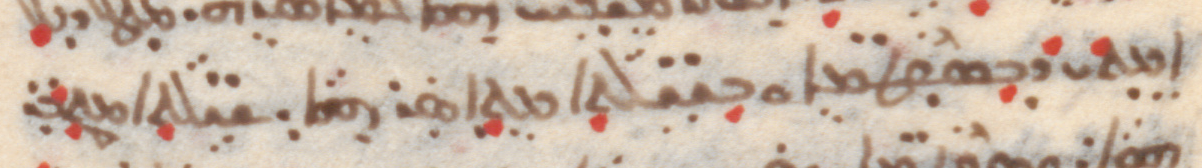ܐܡܬܝ ܕܒܣܘܛܡ̈ܐ ܘܒܫܫ̈ܠܬܐ ܡܬܐܣܪ ܗܘܐ܆ ܫܫ̈ܠܬܐ ܡܬܒܪ
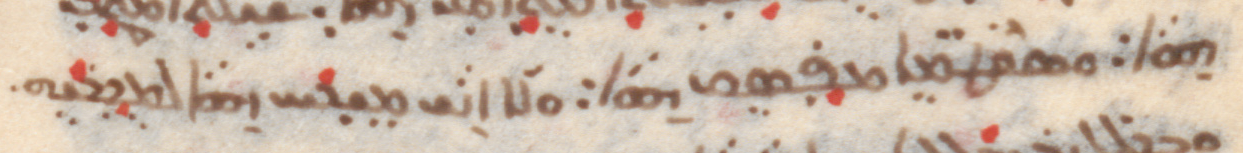ܗܘܐ: ܘܣܘܛܡ̈ܐ ܡܦܣܩ ܗܘܐ܇ ܘܠܐ ܐܢܫ ܡܫܟܚ ܗܘܐ ܠܡܟܒܫܗ
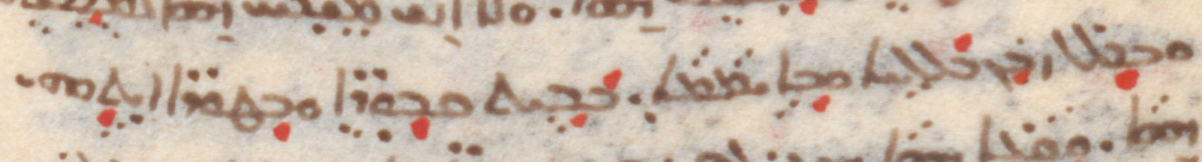ܘܒܟܠ ܙܒܢ ܒܠܠܝܐ ܘܒܐ ܝܡܡܐ܆ ܒܒܝܬ ܩܒܘܪ̈ܐ ܘܒܛܘܪ̈ܐ ܐܝܬܘܗܝ
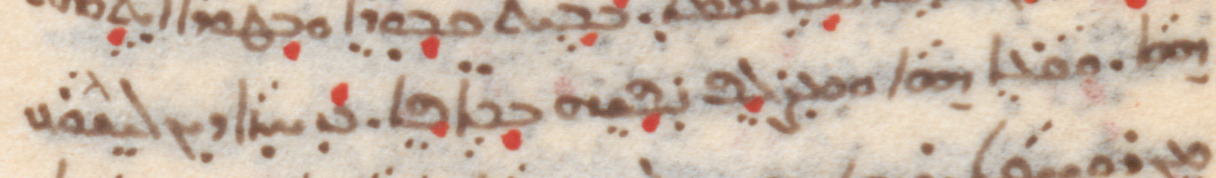ܗܘܐ. ܘܩ̇ܥܐ ܗܘܐ ܘܡܨܠܦ ܢܦܫܗ ܒܟܐ̈ܦܐ. ܟܕ ܚܙܐ ܕܝܢ ܠܝܫܘܥ
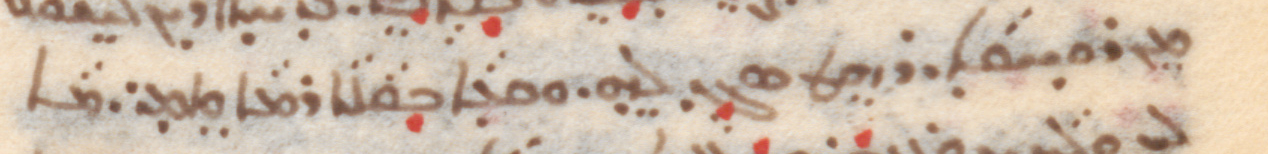ܡܢ ܪܘܚܩܐ. ܪܗܛ ܣܓܕ ܠܗ܆ ܘܩܥ̣ܐ ܒܩܠܐ ܪܡܐ ܘܐܡ̣ܪ. ܡܐ
